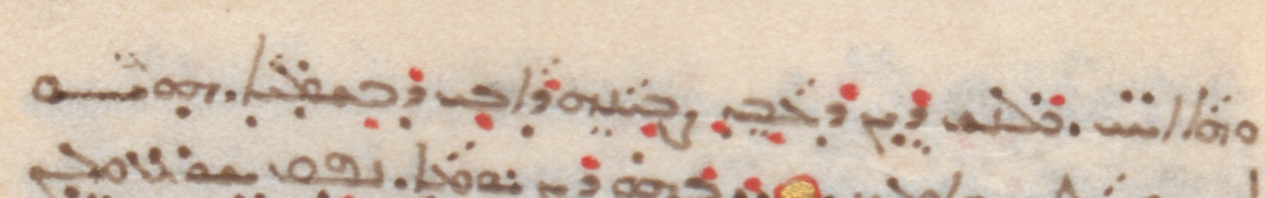ܘܗܐ ܐܚ̈ܝ. ܟܠܢܫ ܕܝܢ ܕܥܒܕ ܨܒܝܢܗ ܕܐܒܝ ܕܒܫܡܝܐ. ܗܘܝܘ
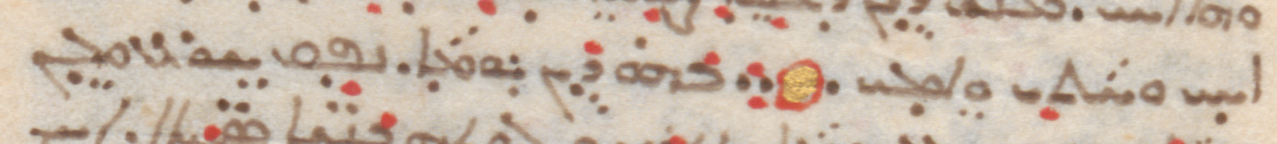ܐܚܝ ܘܚܬܝ ܘܐܡܝ.܀ ܒܗ̇ܘ ܕܝܢ ܝܘܡܐ. ܢܦ̣ܩ ܝܫܘܥ ܡ̣ܢ
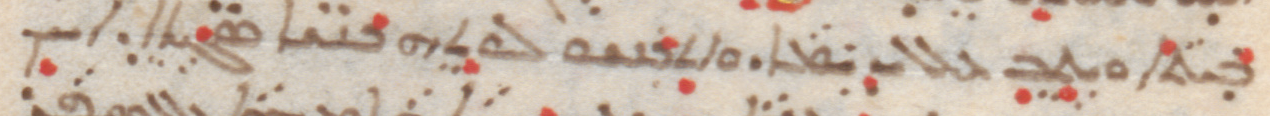ܒܝܬܐ ܘܝܬܒ ܥܠ ܝܕ ܝܡܐ. ܘܐܬܟܢܫܘ ܠܘܬܗ ܟܢ̈ܫܐ ܣ̈ܓܝܐܐ܆ ܐܝܟ
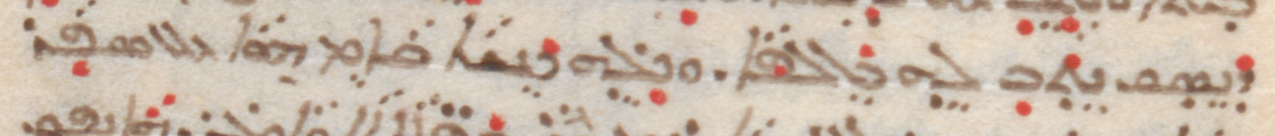ܕܢܣ̣ܩ ܢܬ̣ܒ ܠܗ ܒܐܠܦܐ. ܘܟܠܗ ܟܢܫܐ ܩܐܡ ܗܘܐ ܥܠ ܣܦܪ
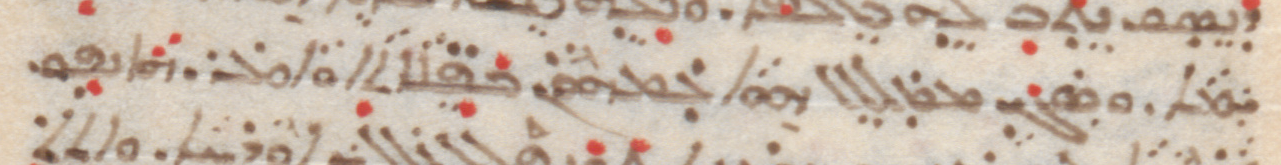ܝܡܐ. ܘܣܓܝ ܡܡܠܠ ܗܘܐ ܥܡܗܘܢ ܒܦ̈ܠܐܬܐ ܘܐܡ̇ܪ. ܗܐ ܢܦ̣ܩ
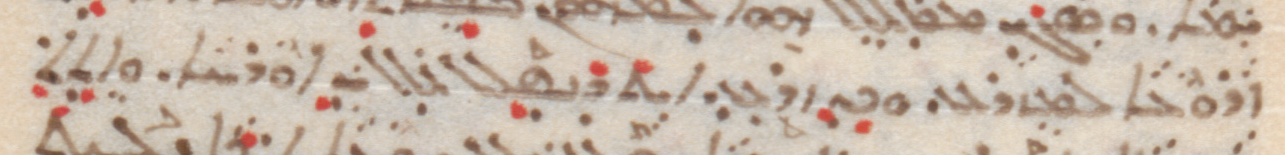ܙܪܘܥܐ ܠܡܙܪܥ. ܘܟܕ ܙܪܥ܆ ܐܝܬ ܕܢܦ̣ܠ ܥܠ ܝܕ ܐܘܪܚܐ. ܘܐܬ̣ܬ
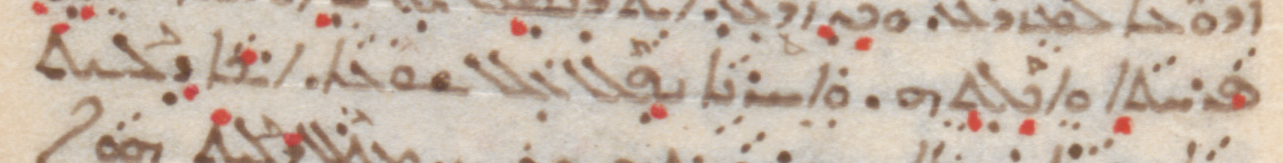ܦܪܚܬܐ ܘܐܟܠܝܬܗ. ܘܐܚܪܢܐ ܢܦ̣ܠ ܥܠ ܫܘܥܐ. ܐܝܟܐ ܕܠܝܬ
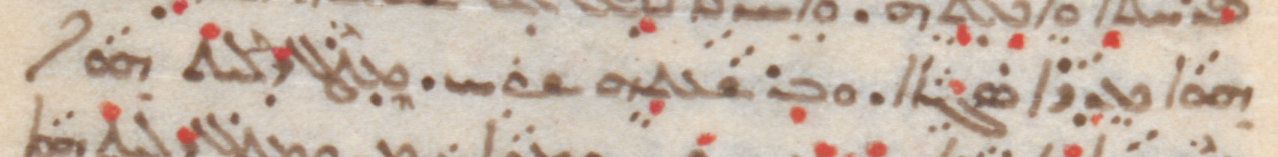ܗܘܐ ܡܕܪܐ ܣܓܝܐܐ. ܘܒܪ ܫܥܬܗ ܫܘܚ. ܡܛܠ ܕܠܝܬ ܗܘܐ
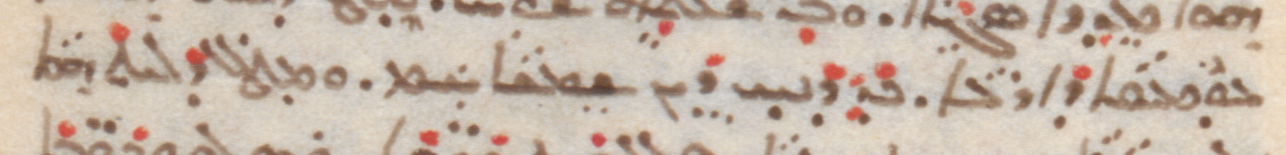ܥܘܡܘܐ ܕܐܪܥܐ. ܟܕ ܕܢ̣ܚ ܕܝܢ ܫܡܫܐ ܚܡ. ܘܡܛܠ ܕܠܝܬ ܗܘܐ
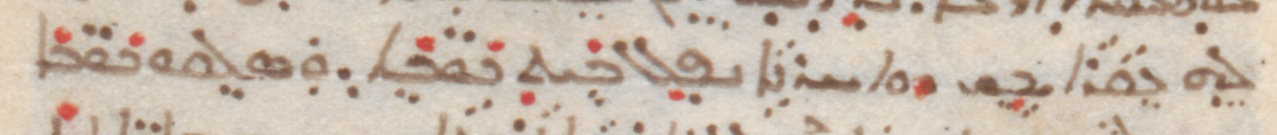ܠܗ ܥܩܪܐ ܝܒܫ. ܘܐܚܪܢܐ ܢܦ̣ܠ ܒܝܬ ܟܘ̈ܒܐ. ܘܣܠܩܘ ܟܘ̈ܒܐ
